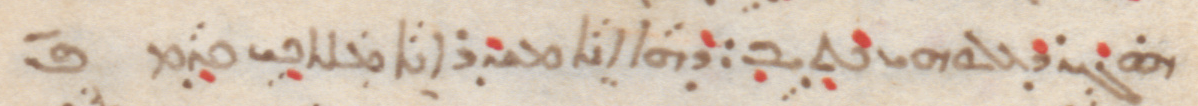ܗܘ ܓܝܪ ܕܥܠܘܗܝ ܟܬܝܒ: ܕܗܐ ܐܢܐ ܡܫܕܪ ܐܢܐ ܡܠܐܟܝ ܩܕܡ ܏ܦ
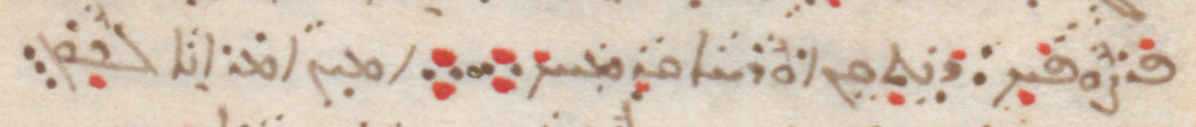ܦܪܨܘܦܟ: ܕܢܬܩܢ ܐܘܪܚܐ ܩܕܡܝܟ܀܀ ܐܡܝܢ ܐܡ̇ܪ ܐܢܐ ܠܟܘܢ܆
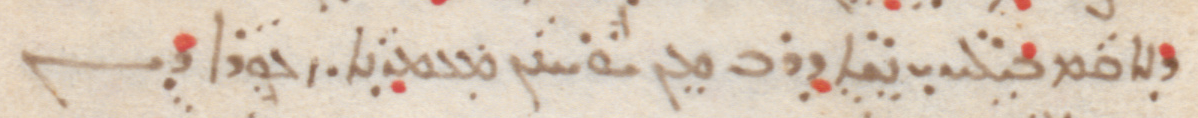ܕܠܐ ܩܡ ܒܝܠ̈ܕܝ ܢ̈ܫܐ ܕܪܒ ܡ̣ܢ ܝܘܚܢܢ ܡܥܡܕܢܐ. ܙܥܘܪܐ ܕܝܢ
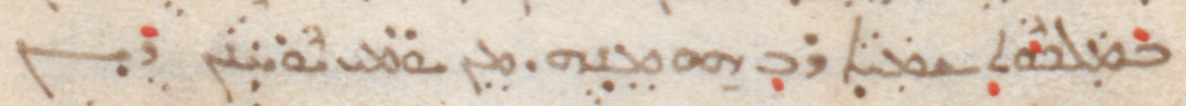ܒܡܠܟܘܬ ܫܡܝܐ ܪܒ ܗܘ ܡܢܗ. ܡ̣ܢ ܝܘ̈ܡܝ ܝܘܚܢܢ ܕܝܢ
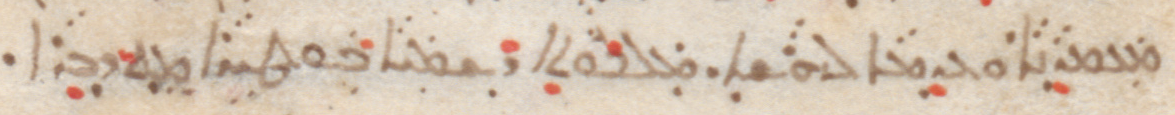ܡܥܡܕܢܐ ܘܥܕܡܐ ܠܗܫܐ. ܡܠܟܘܬܐ ܕܫܡܝܐ ܒܩܛܝܪܐ ܡܬܕܒܪܐ.
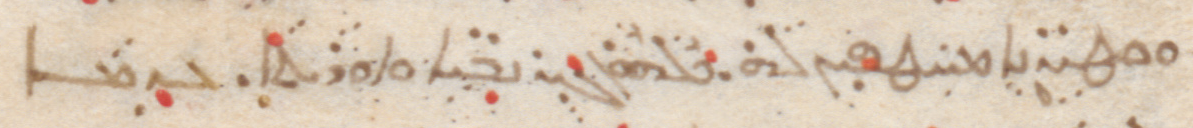ܘܩܛܝܪ̈ܢܐ ܡܚܛܦܝܢ ܠܗ̇. ܟܠܗܘܢ ܓܝܪ ܢܒ̈ܝܐ ܘܐܘܪܝܬܐ. ܥܕܡܐ
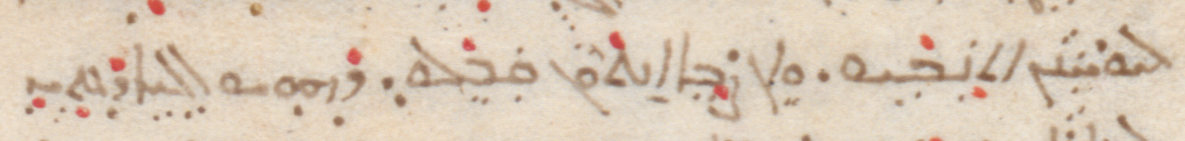ܠܝܘܚܢܢ ܐܬܢܒܝܘ. ܘܐܢ ܨ̇ܒܐ ܐܢܬܘܢ ܩܒ̇ܠܘ܆ ܕܗܘܝܘ ܐܠܝܐ ܕܥܬܝܕ
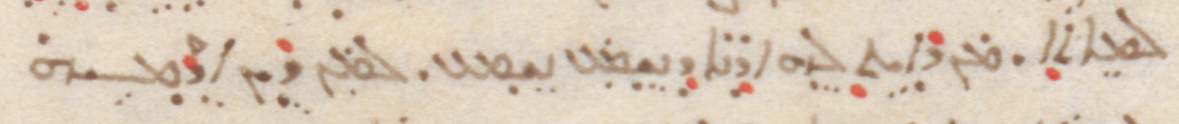ܠܡܐܬܐ. ܡ̇ܢ ܕܐܝܬ ܠܗ ܐܕ̈ܢܐ ܕܢܫ̣ܡܥ ܢܫܡ̣ܥ. ܠܡ̇ܢ ܕܝܢ ܐܕܡܝܗ̇
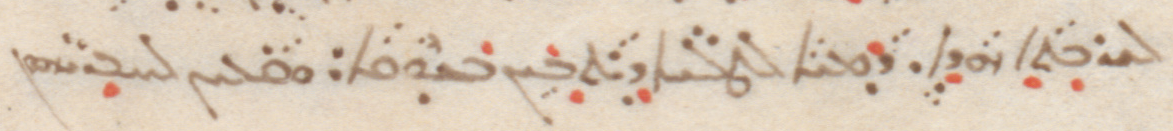ܠܫܪܒܬܐ ܗܕܐ. ܕܡܝܐ ܠܛܠ̈ܝܐ ܕܝ̇ܬܒܝܢ ܒܫܘܩܐ: ܘܩ̇ܥܝܢ ܠܚܒܪ̈ܝܗܘܢ
